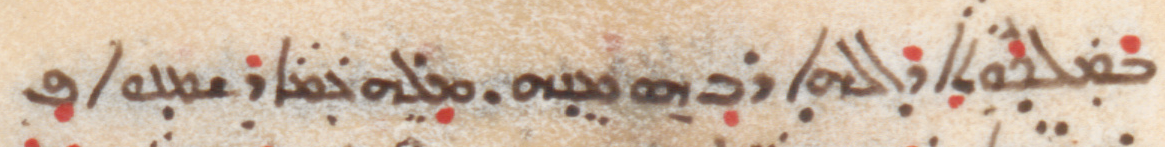ܒܡܠܟܘܬܐ ܕܐܠܗܐ ܪܒ ܗܘ ܡܢܗ. ܘܟܠܗ ܥܡܐ ܕܫܡ̣ܥܘ ܐܦ
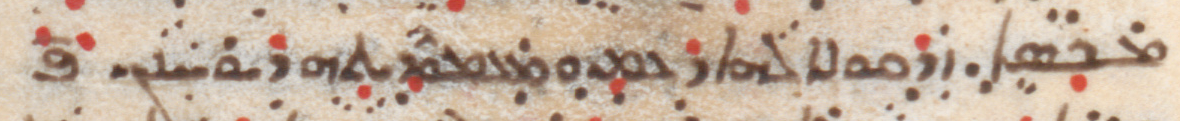ܡܟ̈ܣܐ. ܙܕܩܘ ܠܐܠܗܐ ܕܥܡ̣ܕܘ ܡܥܡܘܕܝܬܗ ܕܝܘܚܢܢ. ܏ܦ
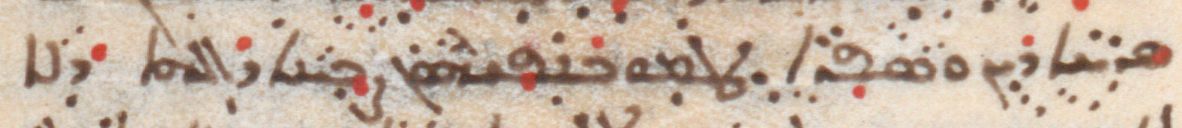ܦܪ̈ܝܫܐ ܕܝܢ ܘܣܦܪ̈ܐ܆ ܛܠܡܘ ܒܢܦܫܗܘܢ ܨܒܝܢܐ ܕܐܠܗܐ ܕܠܐ
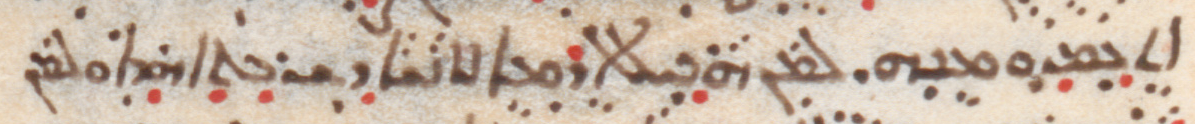ܐܬܥܡ̣ܕܘ ܡܢܗ. ܠܡ̇ܢ ܗ̇ܟ̣ܝܠ ܐܕܡ̣ܐ ܠܐܢ̈ܫܐ ܕܫܪܒܬܐ ܗ̇ܕܐ ܘܠܡ̇ܢ
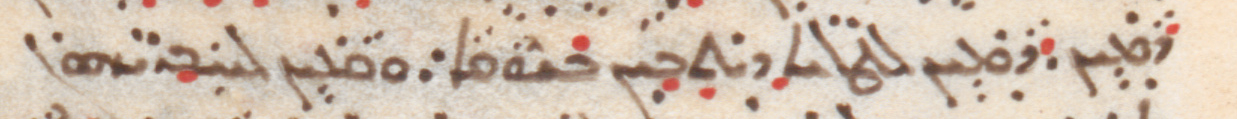ܕܡ̇ܝܢ. ܕܡ̇ܝܢ ܠܛܠ̈ܝܐ ܕܝ̇ܬܒ̣ܝܢ ܒܫܘܩܐ܇ ܘܩ̇ܥܝܢ ܠܚܒܪ̈ܝܗܘܢ
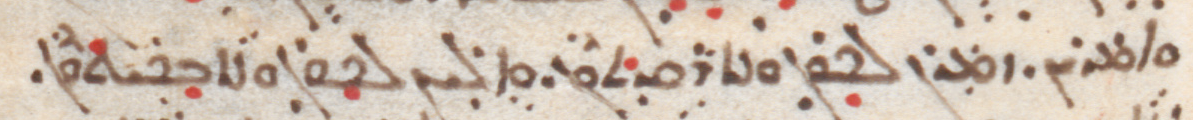ܘܐܡ̇ܪܝܢ. ܙܡ̣ܪܢ ܠܟܘܢ ܘܠܐ ܪܩܕܬܘܢ. ܘܐܠܝܢ ܠܟܘܢ ܘܠܐ ܒܟܝܬܘܢ.
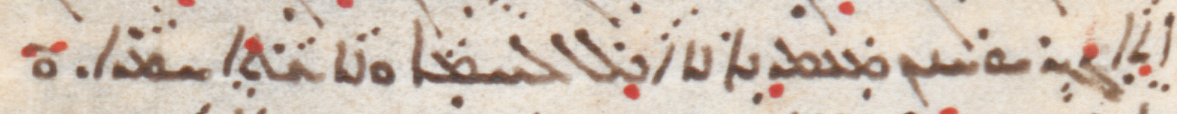ܐܬ̣ܐܓܝܪ ܝܘܚܢܢ ܡܥܡܕܢܐ ܠܐ ܐܟ̣ܠ ܠܚܡܐ ܘܠܐ ܫ̇ܬܐ ܚܡܪܐ. ܏ܘ
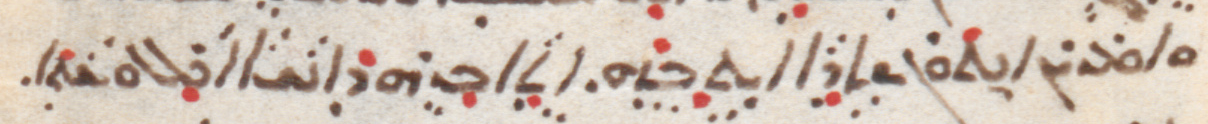ܘܐܡ̇ܪܝܢ ܐܢܬܘܢ ܫܐܕܐ ܐܝܬ ܒܗ. ܐܬ̣ܐ ܒܪܗ ܕܐܢܫܐ ܐܟ̣ܠ ܘܫ̇ܬܐ܆
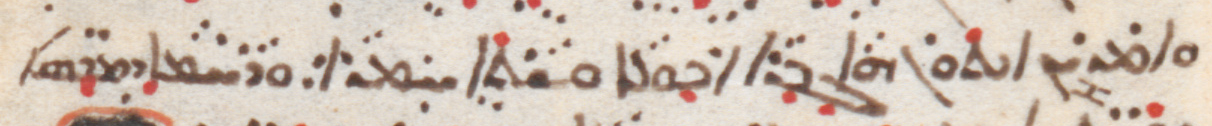ܘܐܡ̇ܪܝܢ ܐܢܬܘܢ ܗܐ ܓܒܪܐ ܐܟܘܠܐ ܘܫ̇ܬܐ ܚܡܪܐ܇ ܘܪܚܡܐ ܕܡܟ̈ܣܐ
